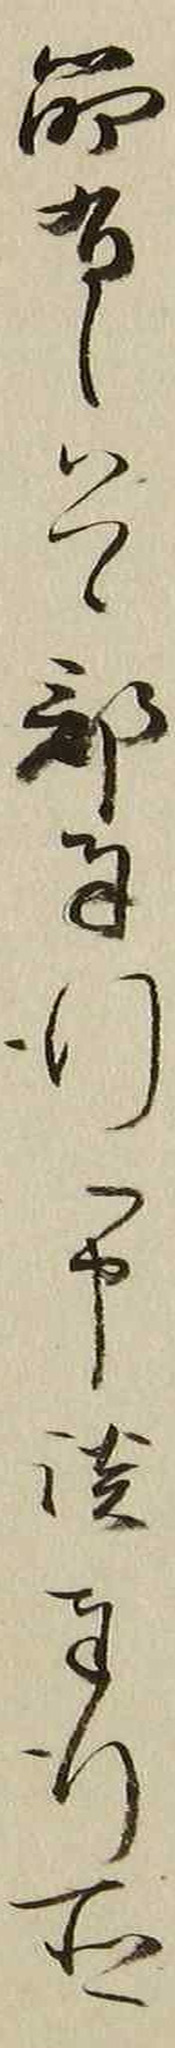節有之候ハヽ郡奉行へ申談奉行所へ
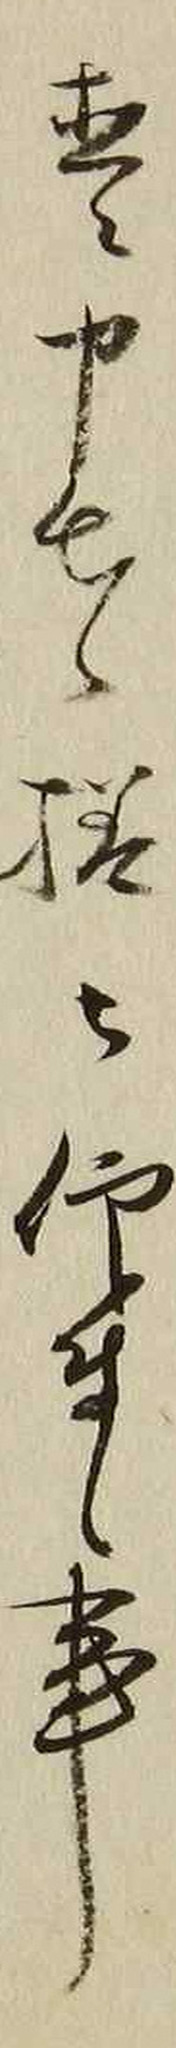直ニ申出候様被仰付候事
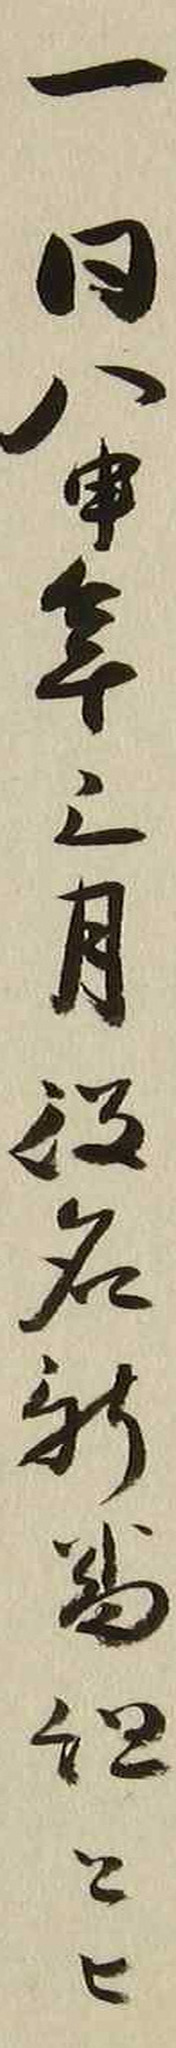一同八申年三月役名新番組と被
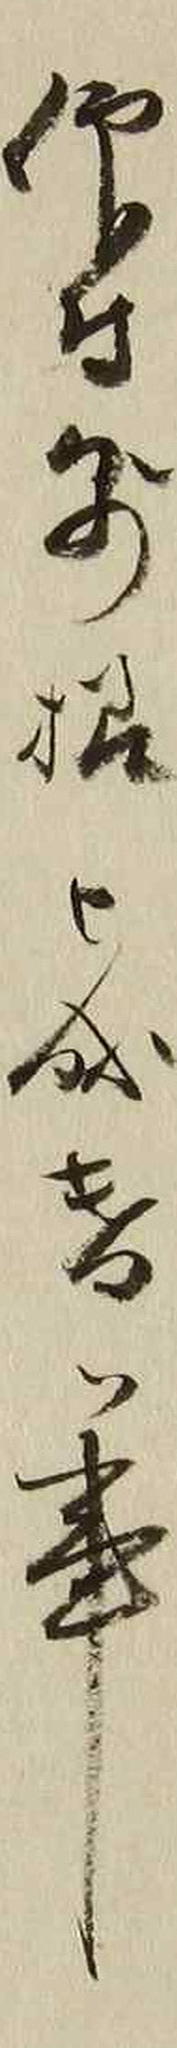仰付別様被成替候事
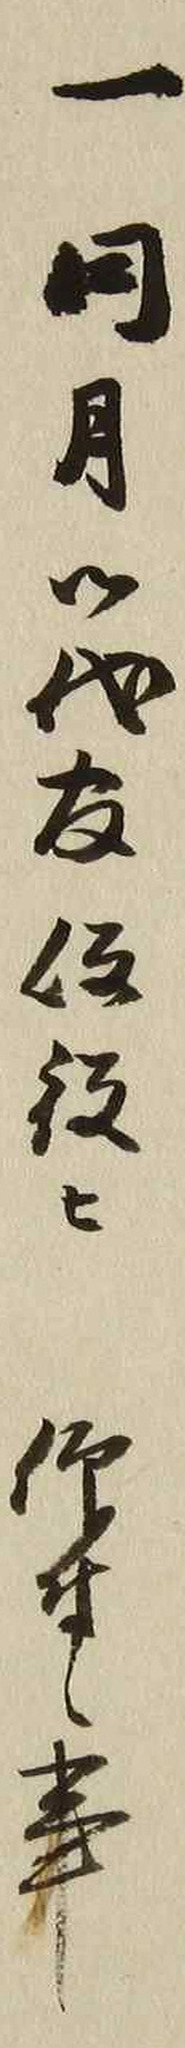一同月御代官仮役被仰付候事
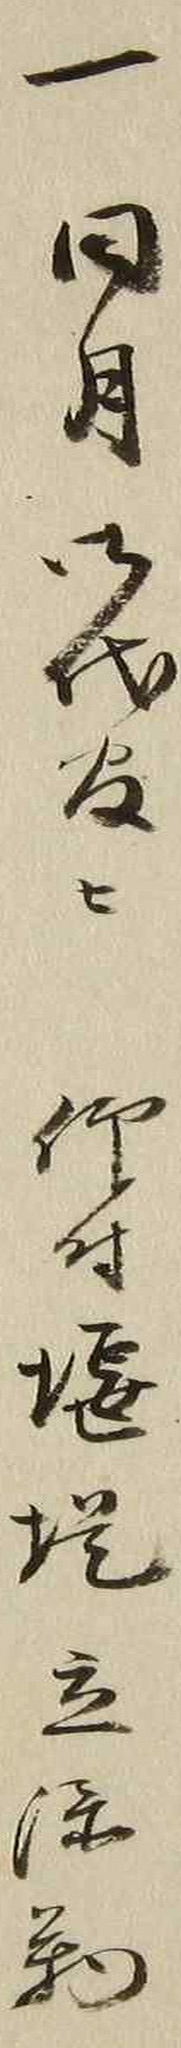一同月御代官被仰付堰堤立添勤
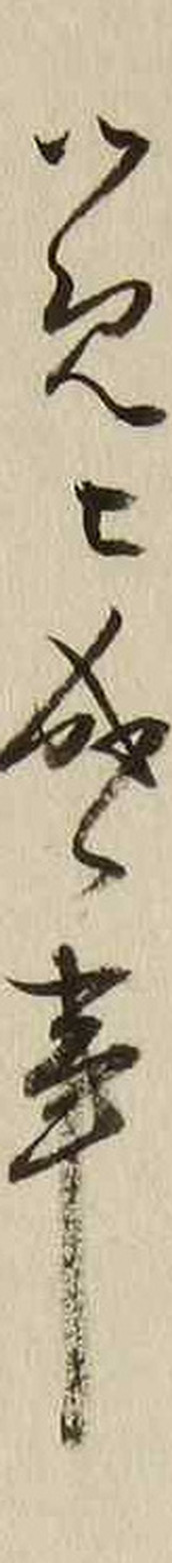御免被成候事
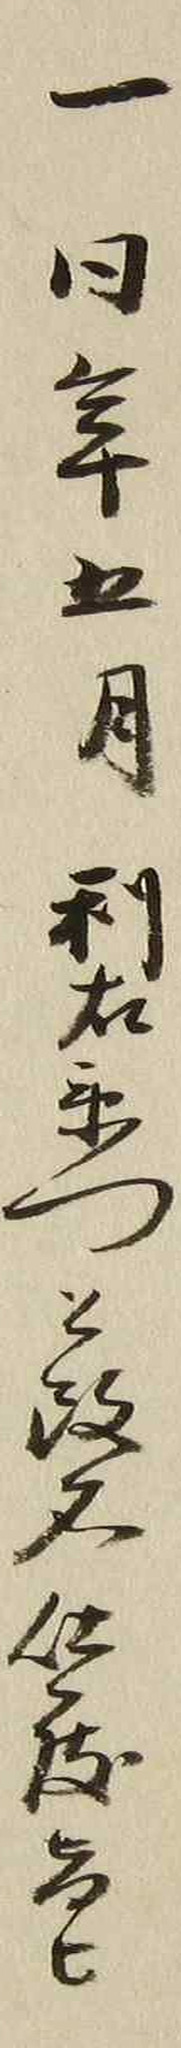一同年五月利右衛門と改名仕度旨被
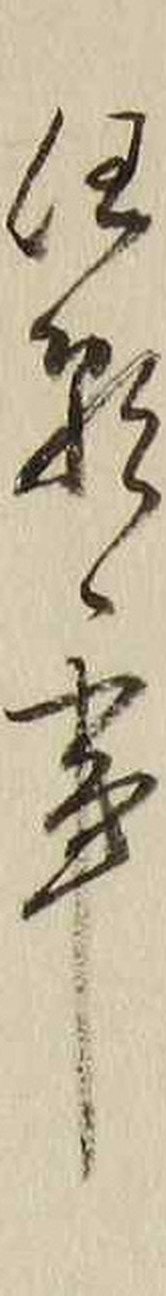任願候事
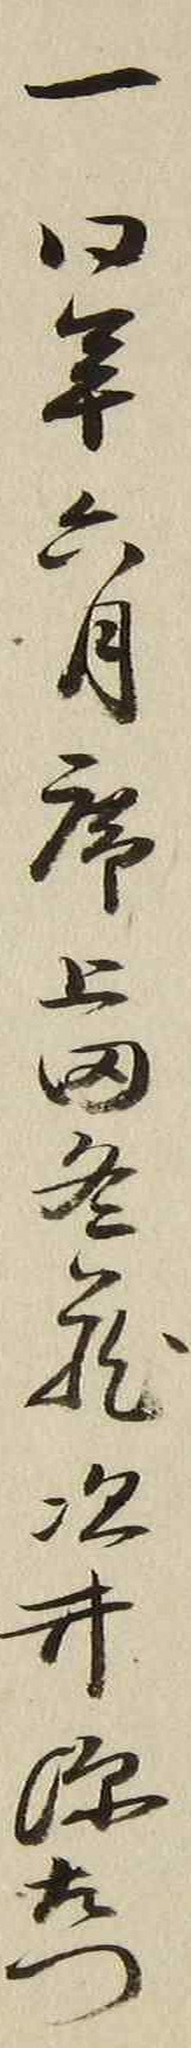一同年六月席上田冬蔵次井源左門
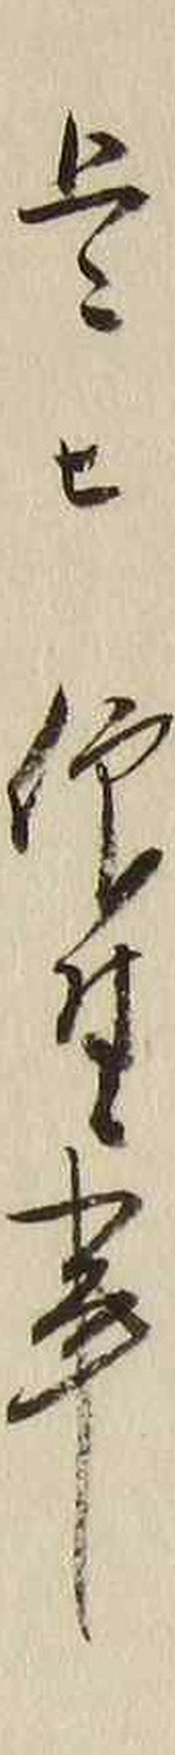上ニ被仰付候事
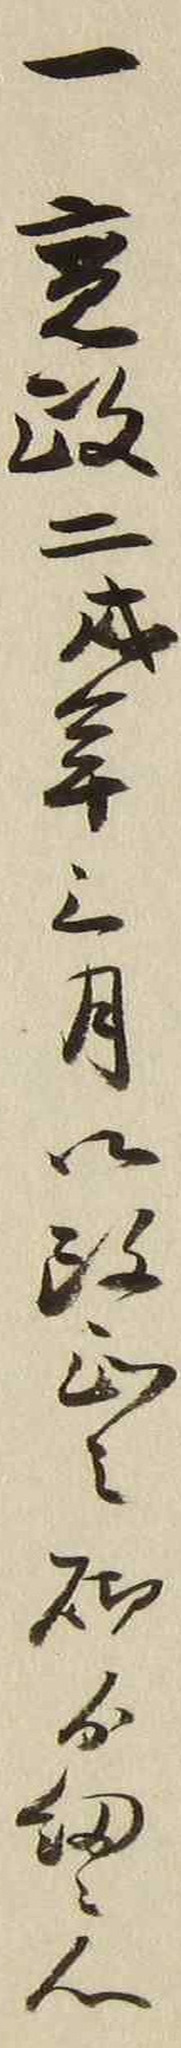一寛政二戌年三月御改正之砌ゟ細々心
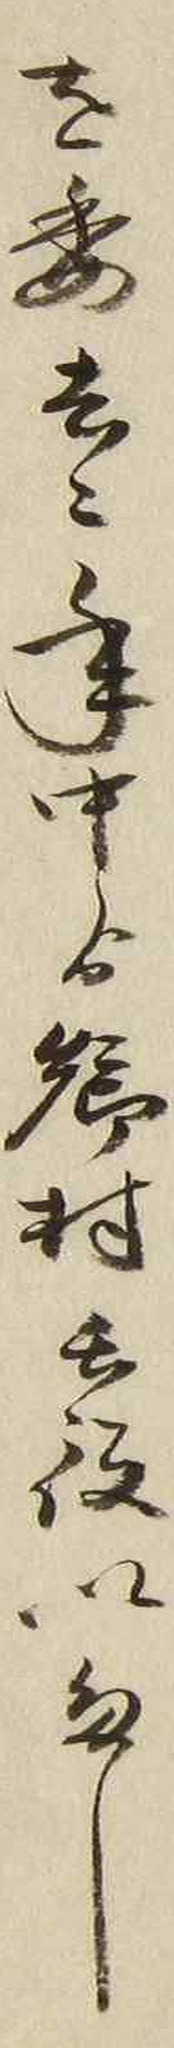を委去々年中ゟ郷村出役いたし
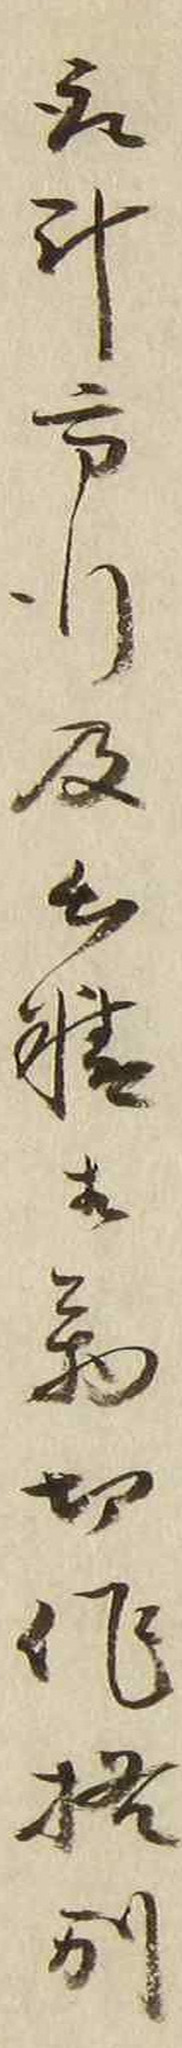取計方行及出精相勤功作格別

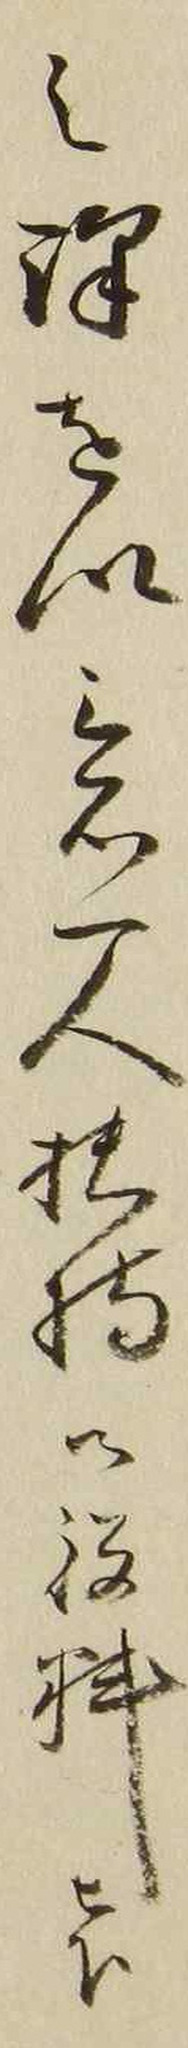之訳を以三石一人扶持御役料被下
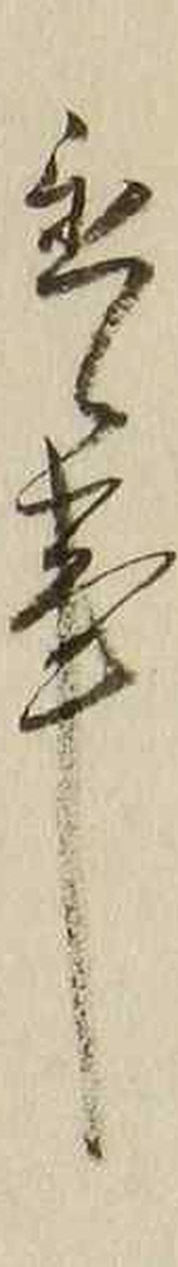置候事
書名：諸士系譜　巻之288　さ之部20
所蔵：会津若松市立会津図書館
